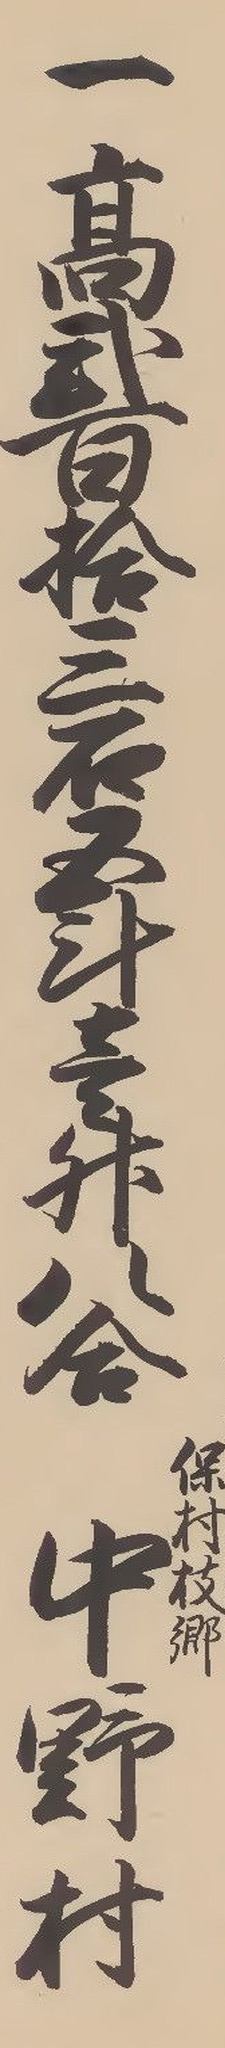一高弐百拾三石五斗壱升八合中野村
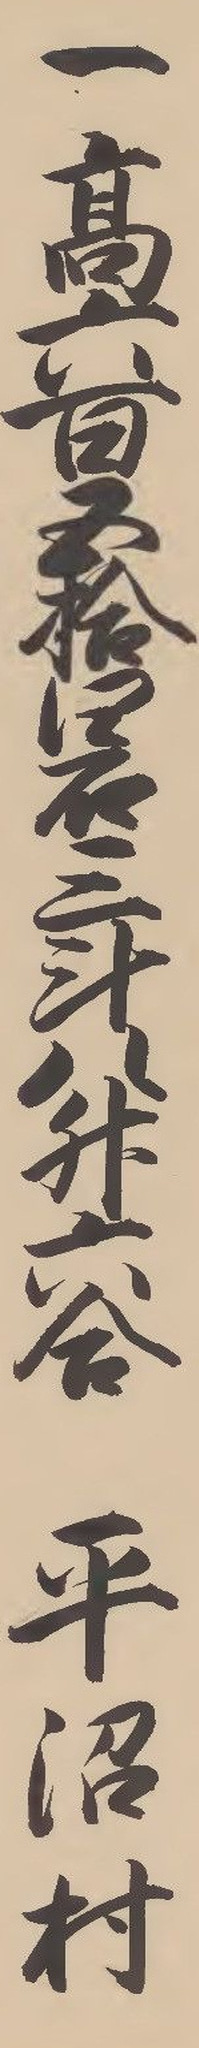一高六百五拾四石三斗八升六合平沼村
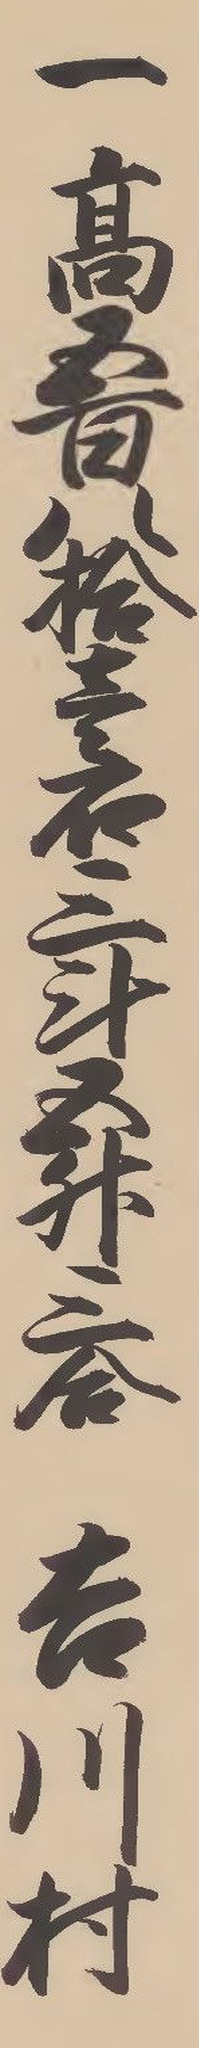一高五百八拾壱石三斗五升三合吉川村
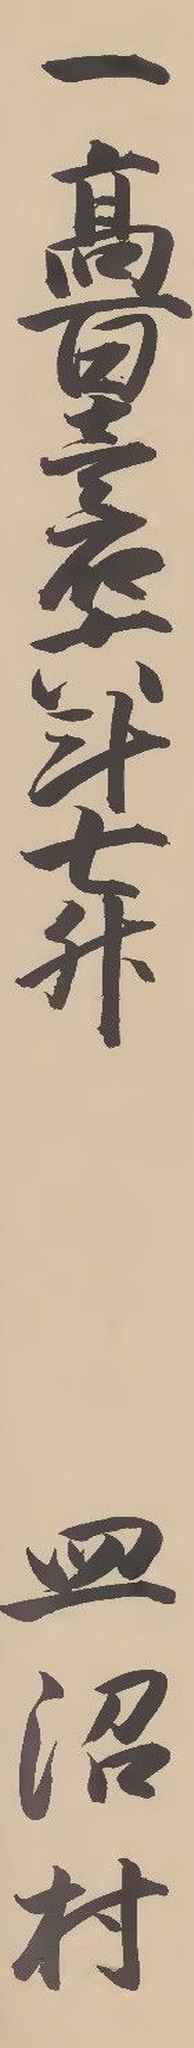一高百壱石六斗七升皿沼村
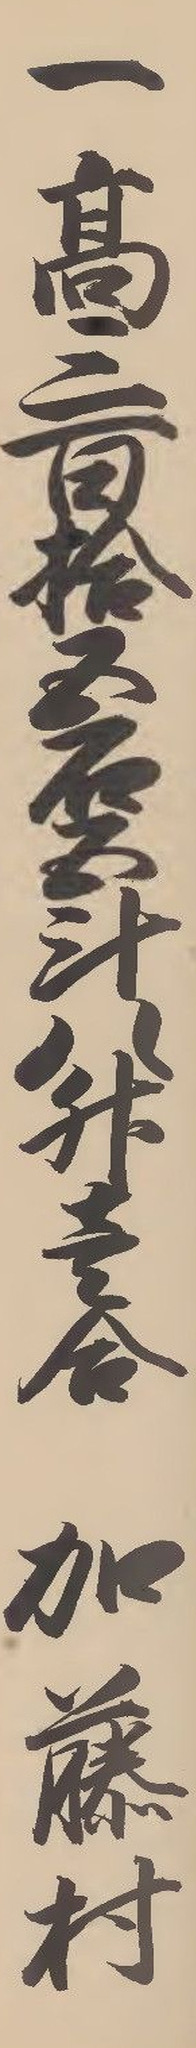一高三百拾五石五斗八升壱合加藤村
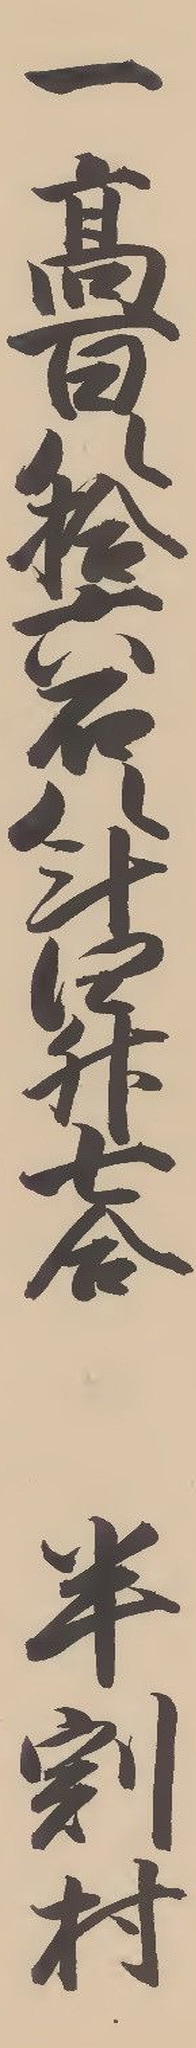一高百八拾六石八斗四升七合半割村
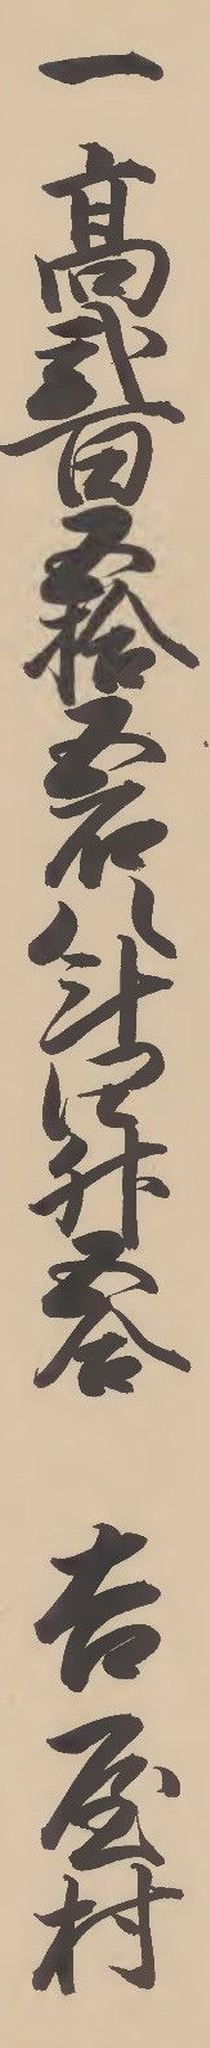一高弐百五拾五石八斗四升五合吉屋村
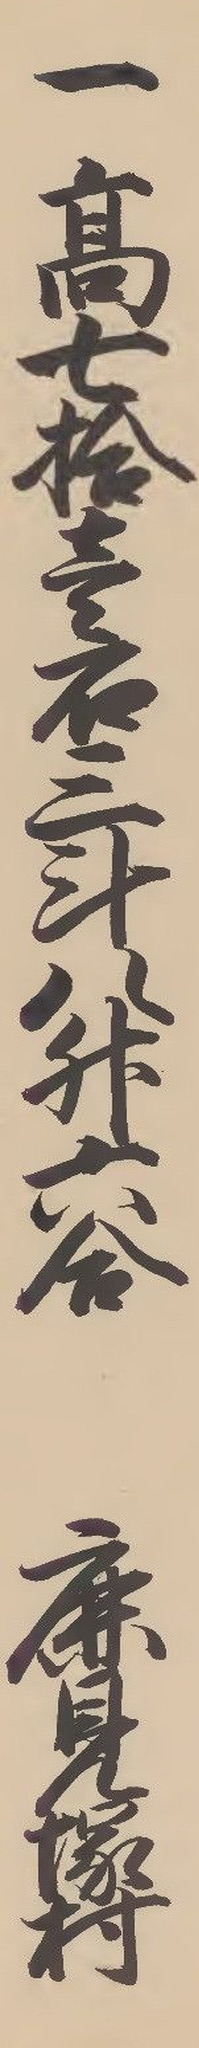一高七拾壱石三斗八升六合鹿見塚村

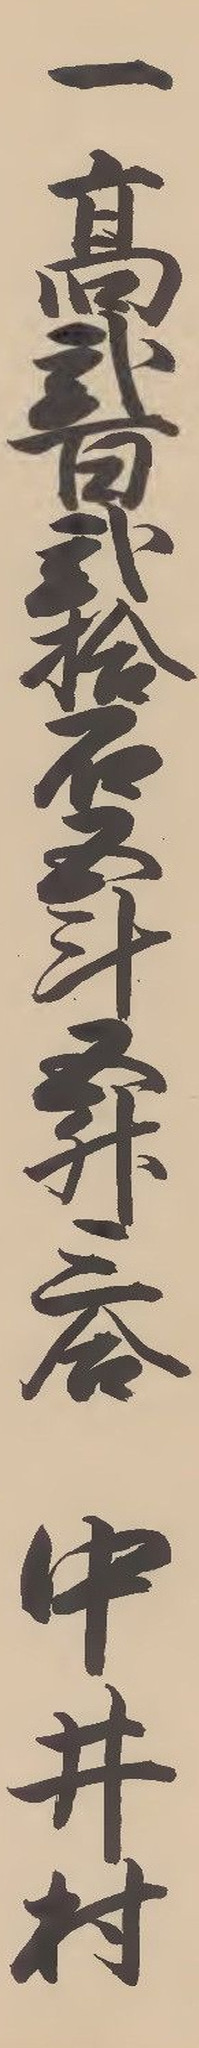一高弐百弐拾石五斗五升三合中井村
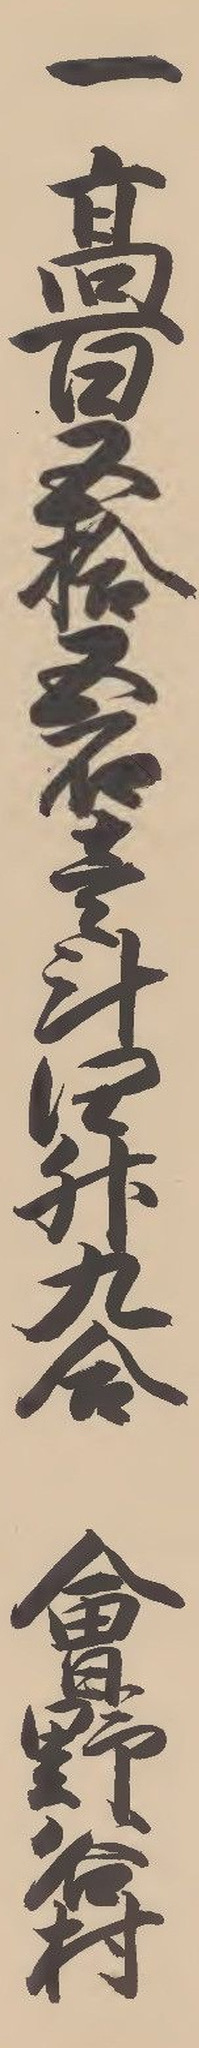一高百五拾五石壱斗四升九合会野谷村
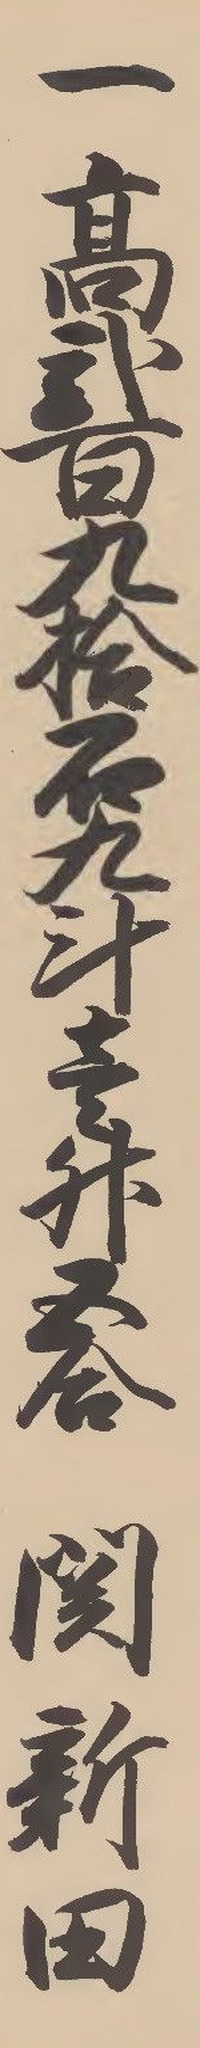一高弐百九拾石九斗壱升五合関新田
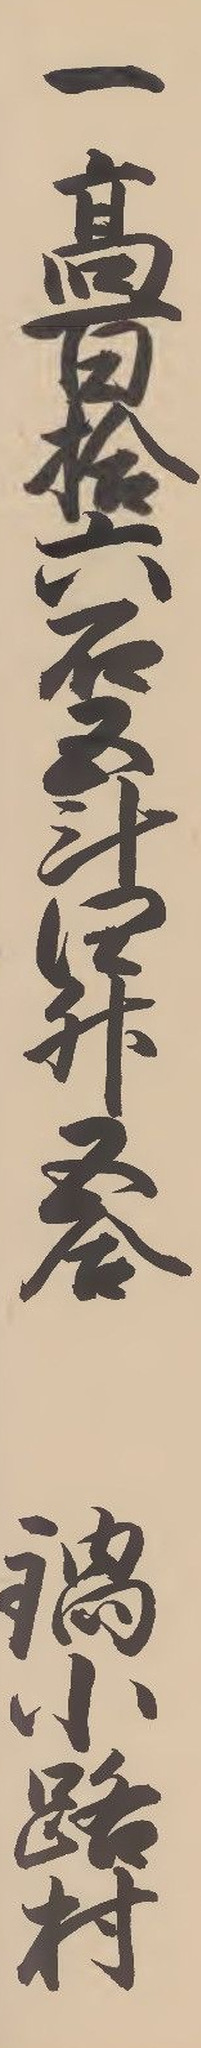一高百拾六石五斗四升五合鍋小路村
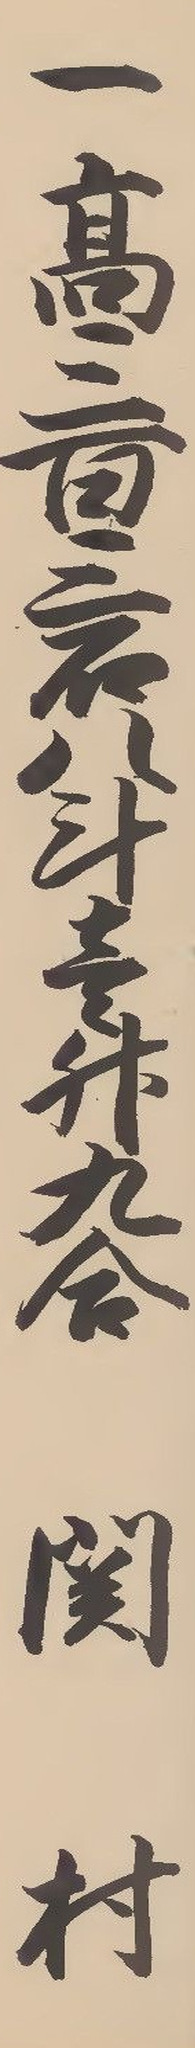一高三百三石八斗壱升九合関村
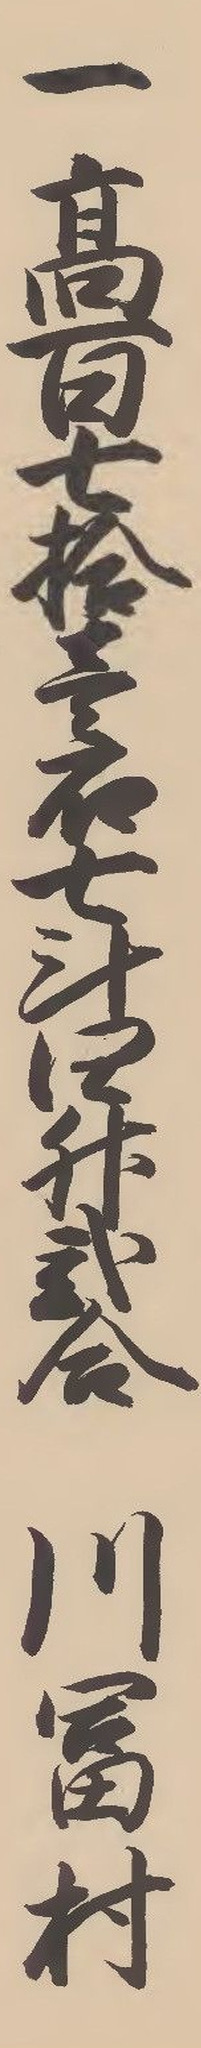一高百七拾壱石七斗四升弐合川冨村
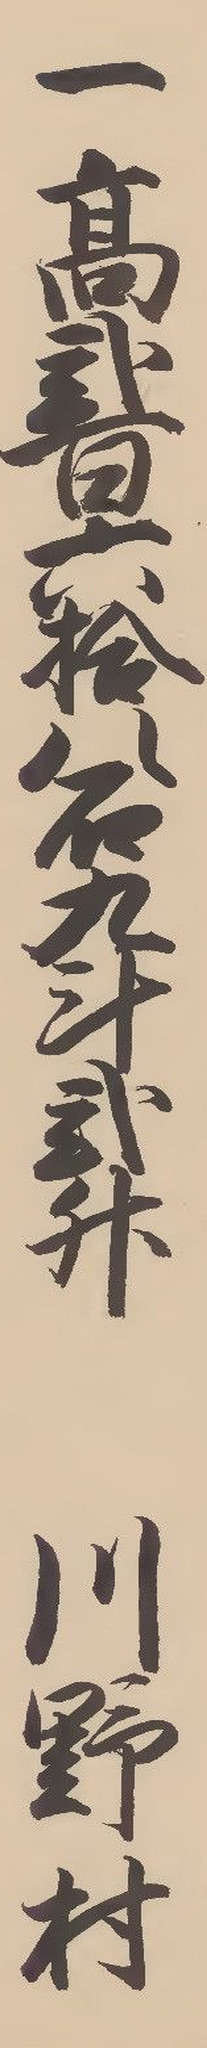一高弐百六拾八石九斗弐升川野村
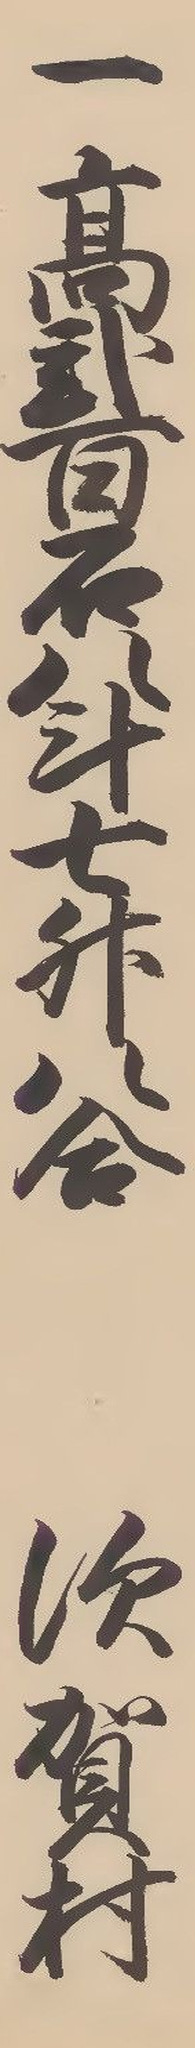一高弐百石八斗七升八合須賀村
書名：武蔵国郷帳　下
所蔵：国立公文書館 National Archives of Japan
